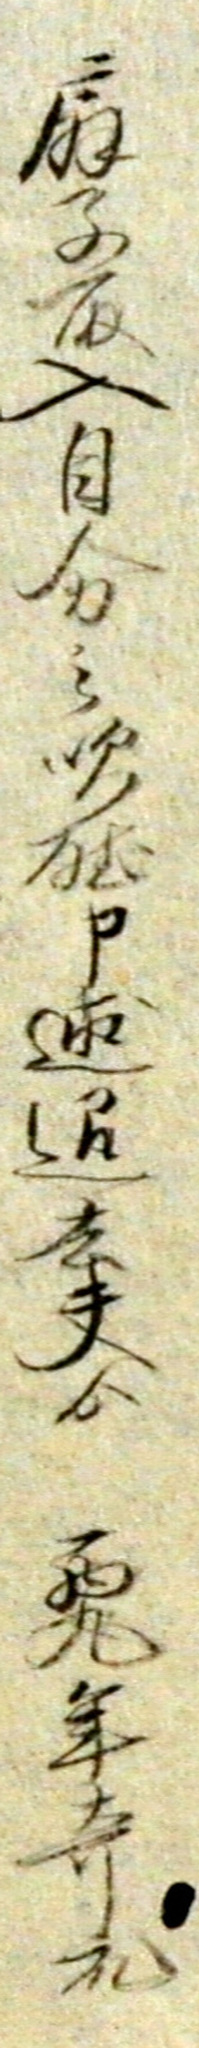扇子取入自分之吹聴申述退去夫ゟ西丸年寄衆
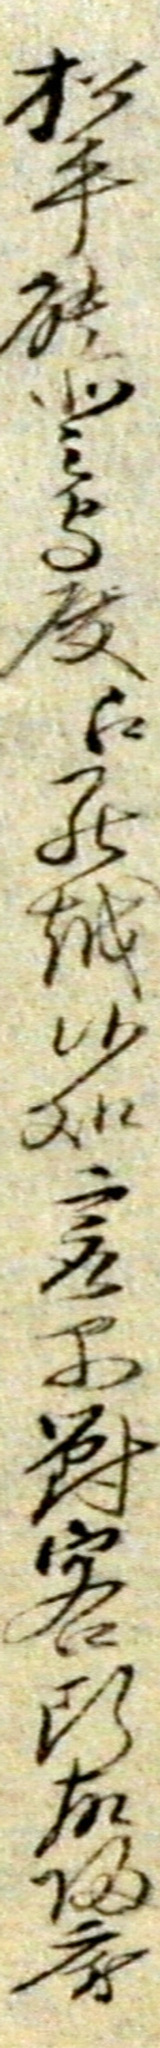松平能登守殿江罷越候処最早対客断故帰府
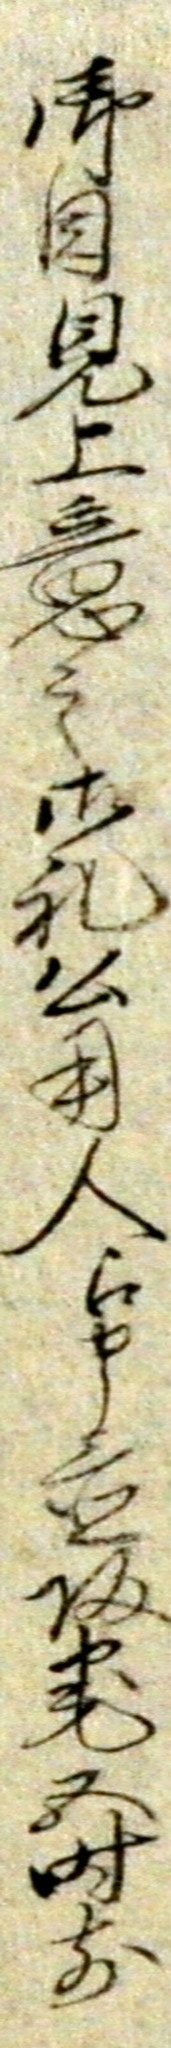御目見上意之御礼公用人江申置帰宅五時前
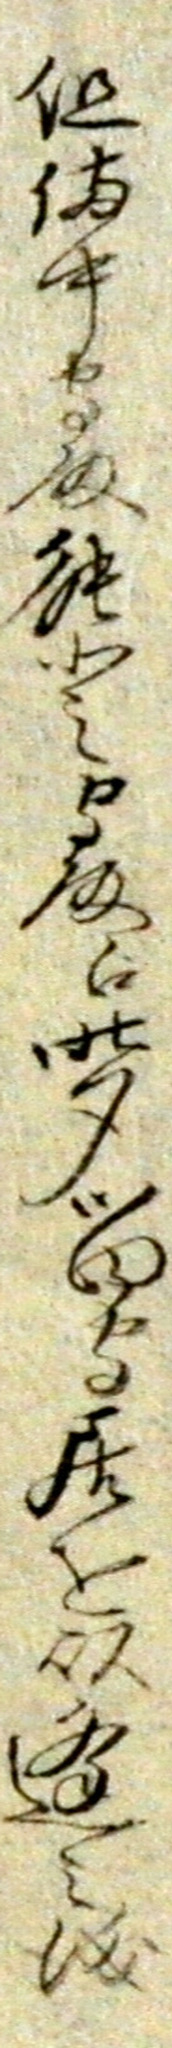但備中守殿能登守殿江昨夕留守居を以逢之儀
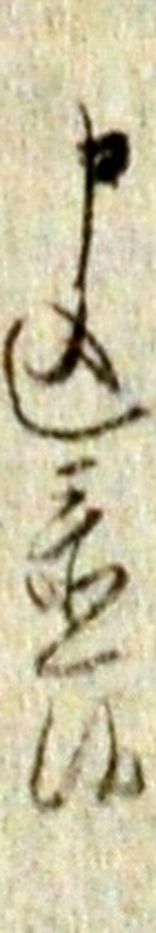申込置候

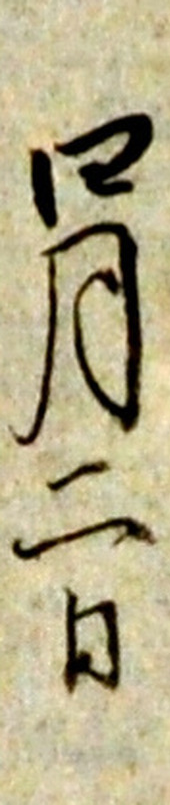四月二日
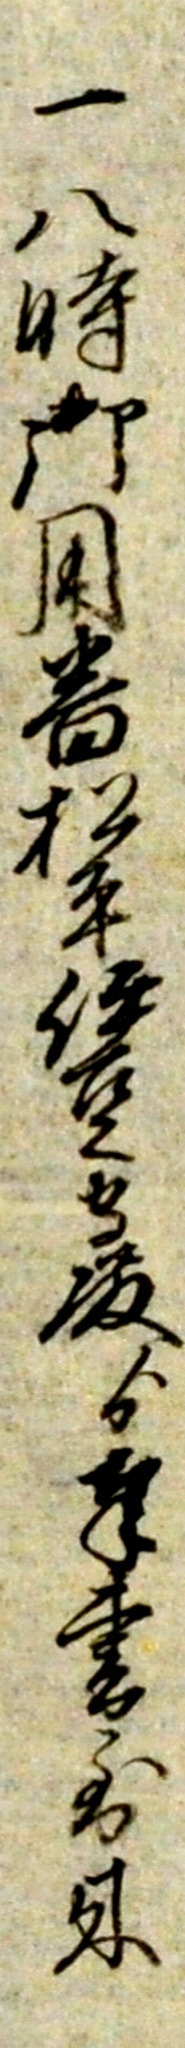一八御用番松平伊豆守殿ゟ奉書到来
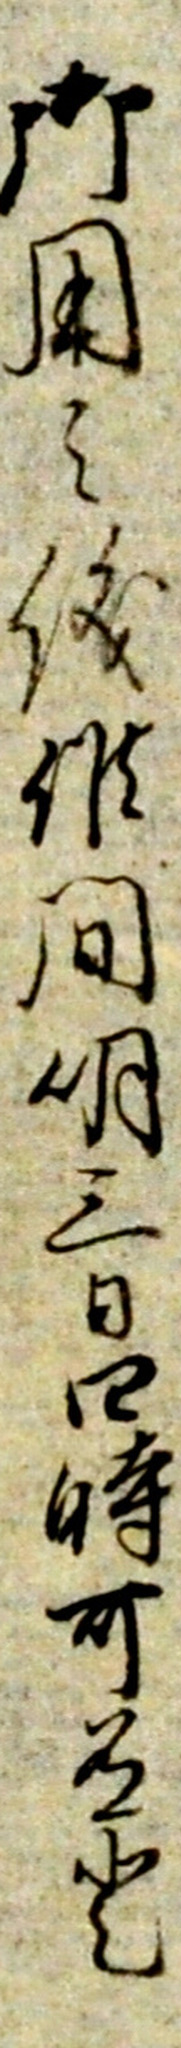御用之儀候間明三日四時可有登
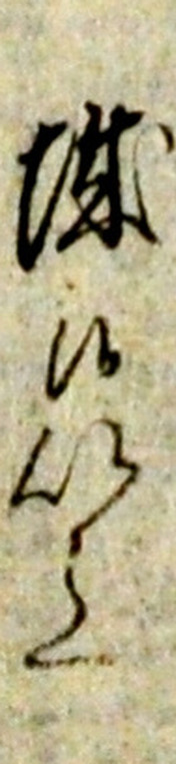城候以上
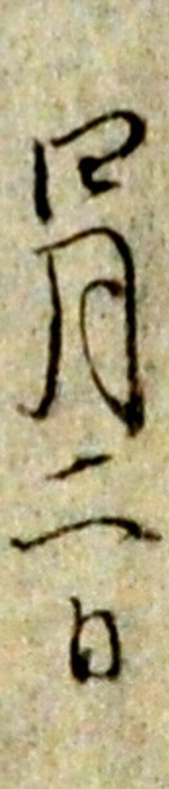四月二日
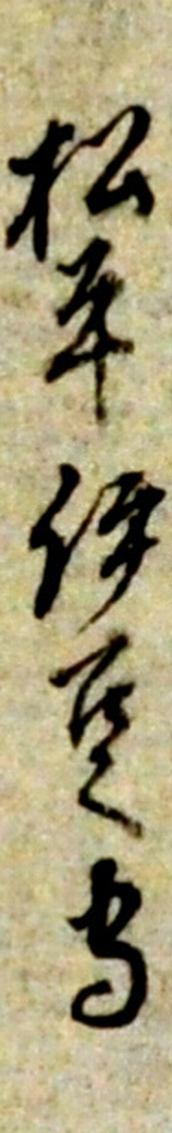松平伊豆守
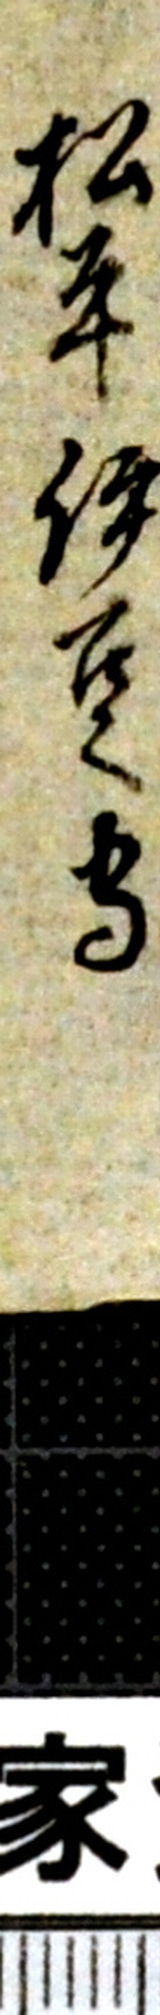松平伊豆守
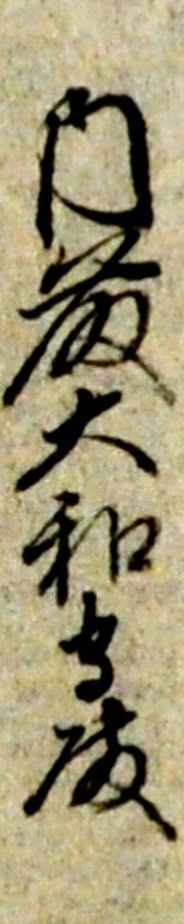内藤大和守殿
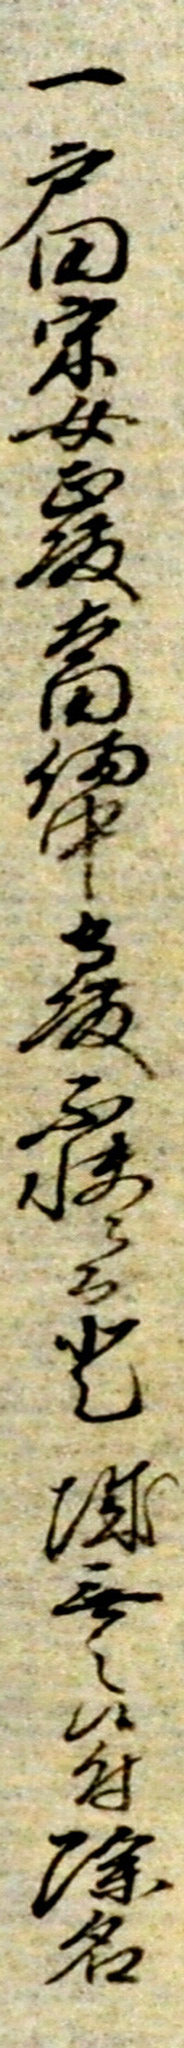一戸田采女正殿太田備中守殿不快二而登城無之候二付除名
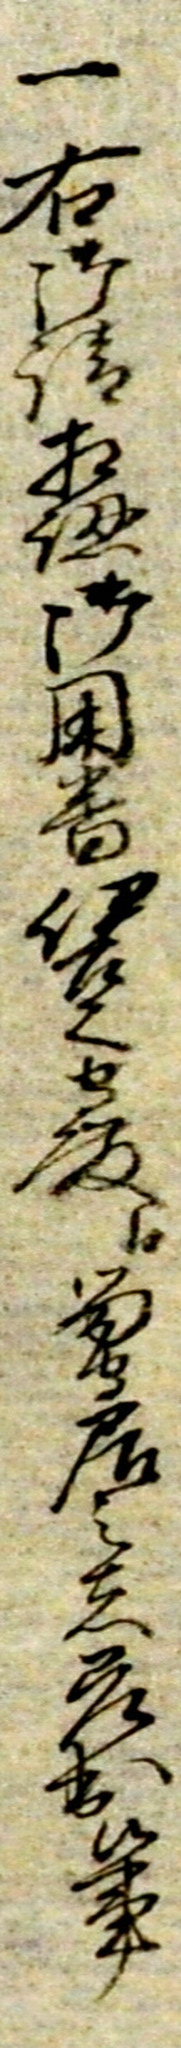一右御請相役御用番伊豆守殿留守居之者差出候事
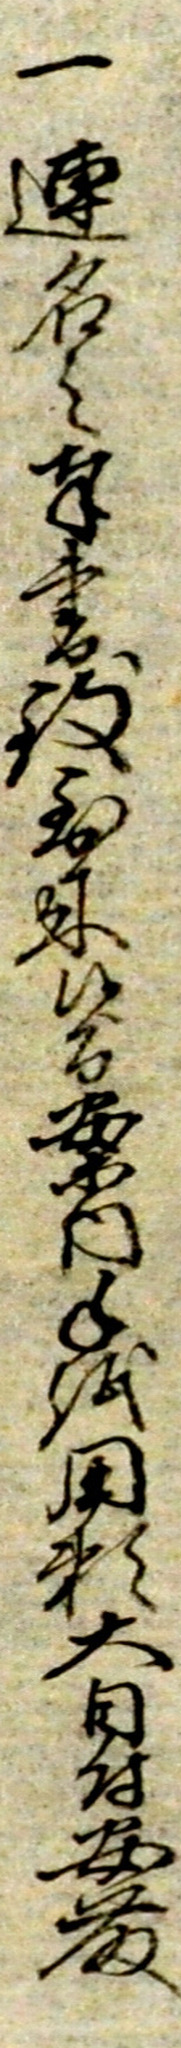一連名之奉書致到来候間案内手紙用頼大目付安藤
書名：日光御名代相勤候節ノ留
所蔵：伊那市立高遠町図書館・合同会社AMANE
